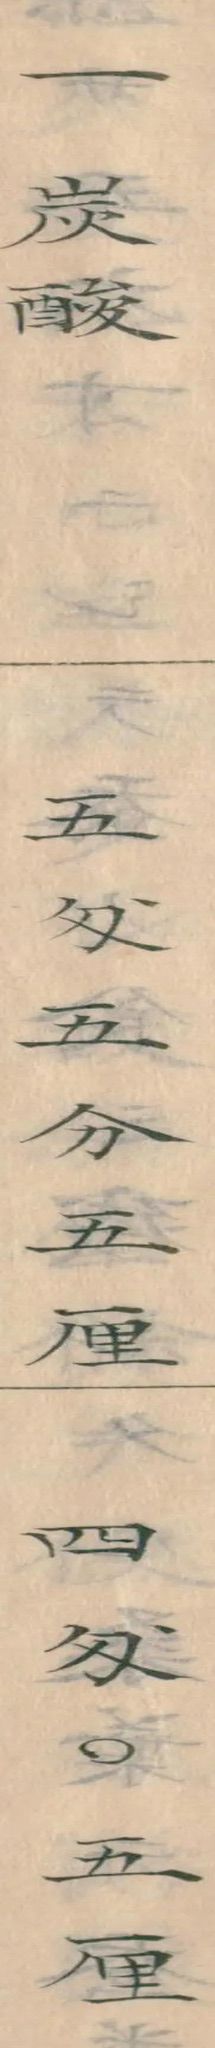一炭酸五匁五分五厘四匁◦五厘
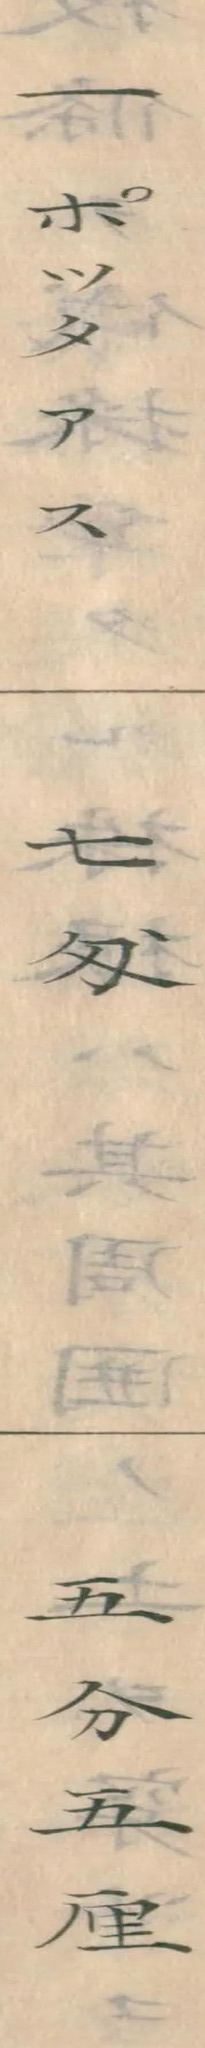一ポツタアス七匁五分五厘
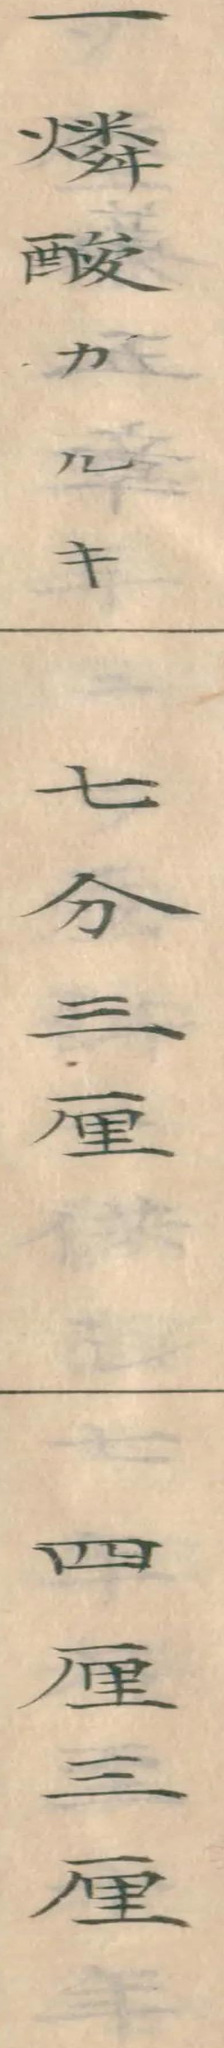一燐酸カルキ七分三厘四厘三厘
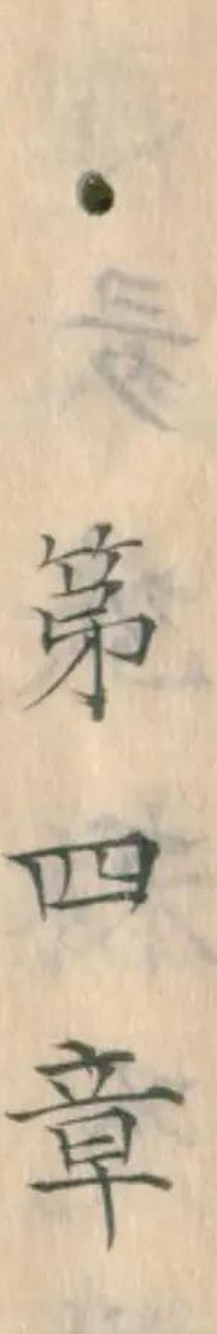第四章
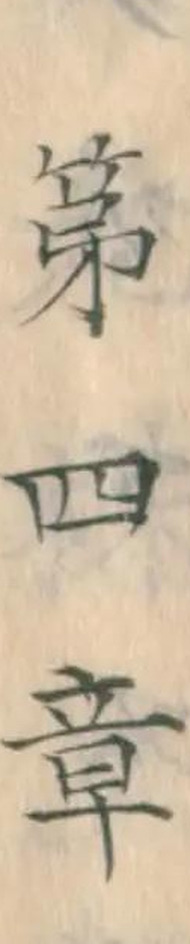第四章
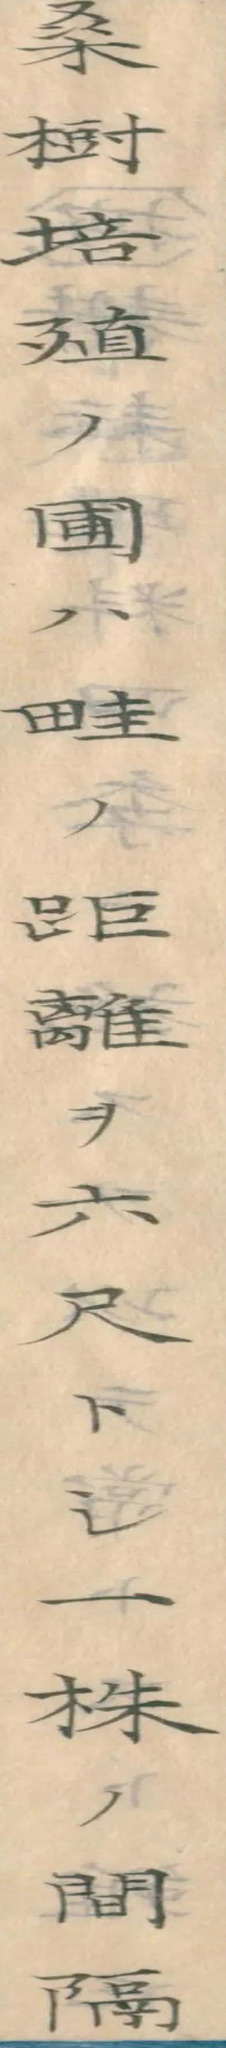桑樹培殖ノ圃ハ畦ノ距離ヲ六尺トシ一株ノ間隔
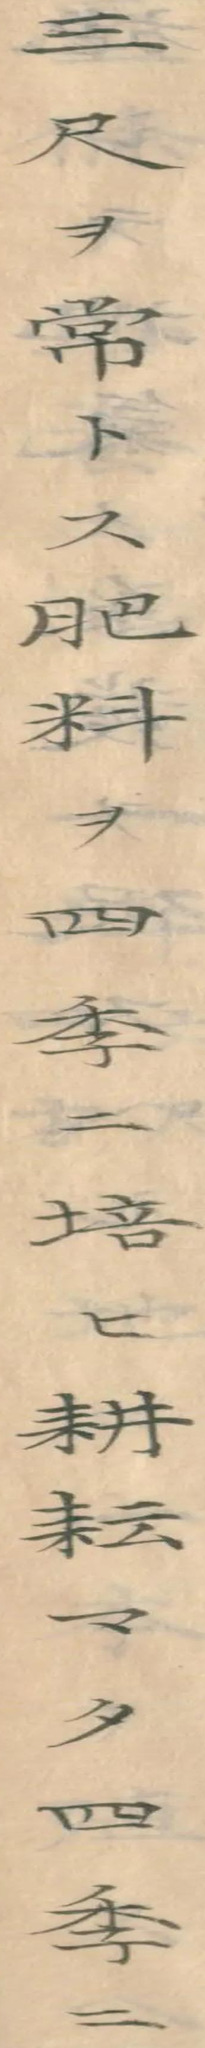三尺ヲ常トス肥料ヲ四季ニ培ヒ耕耘マタ四季ニ

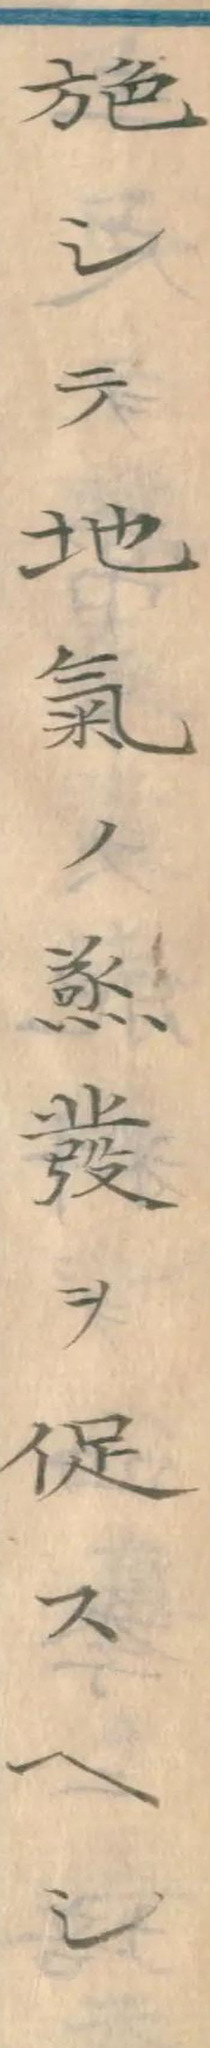施シテ地気ノ蒸発ヲ促スヘシ
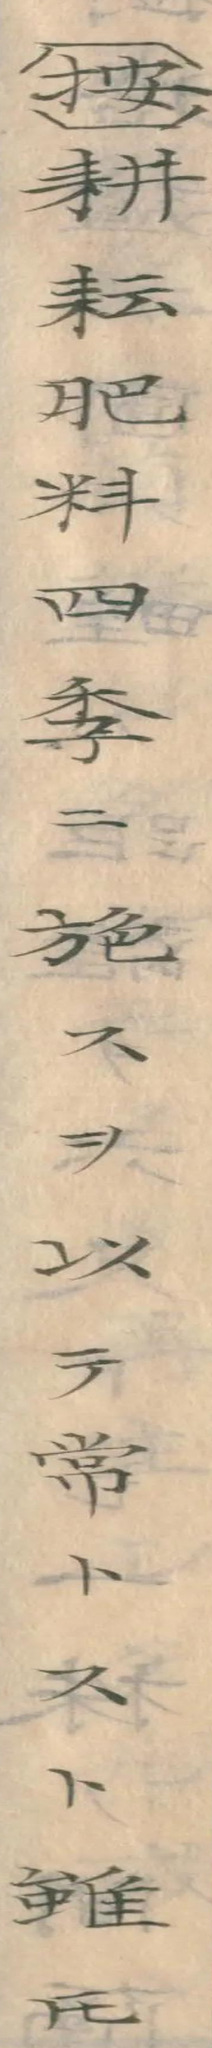[按]耕耘肥料四季ニ施スヲ以テ常トスト雖トモ
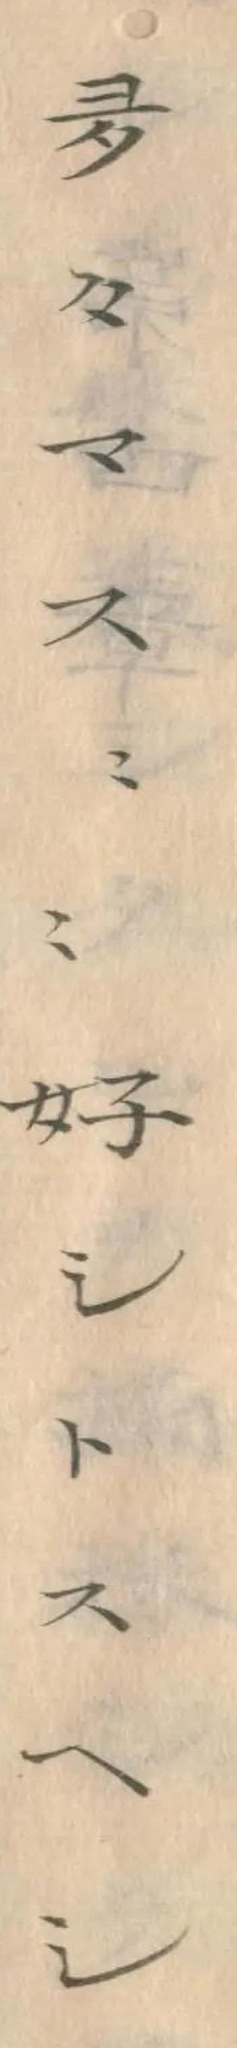多々マスヽヽ好シトスヘシ
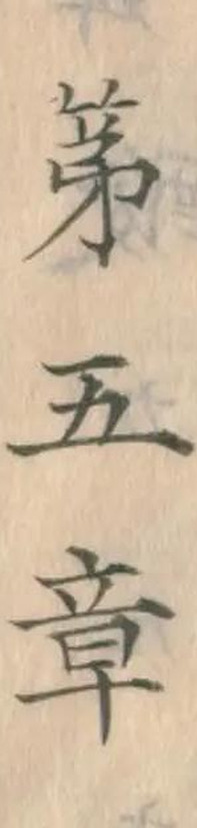第五章
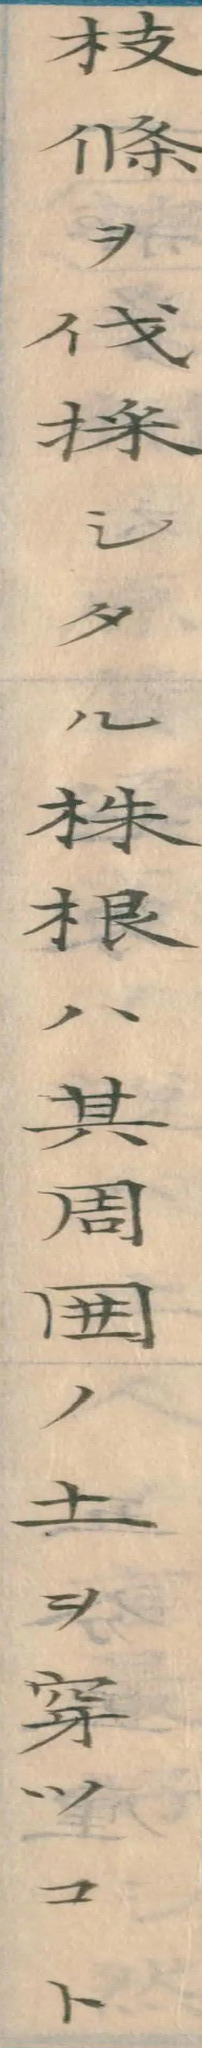枝条ヲ伐採シタル株根ハ其周囲ノ土ヲ穿ツコト
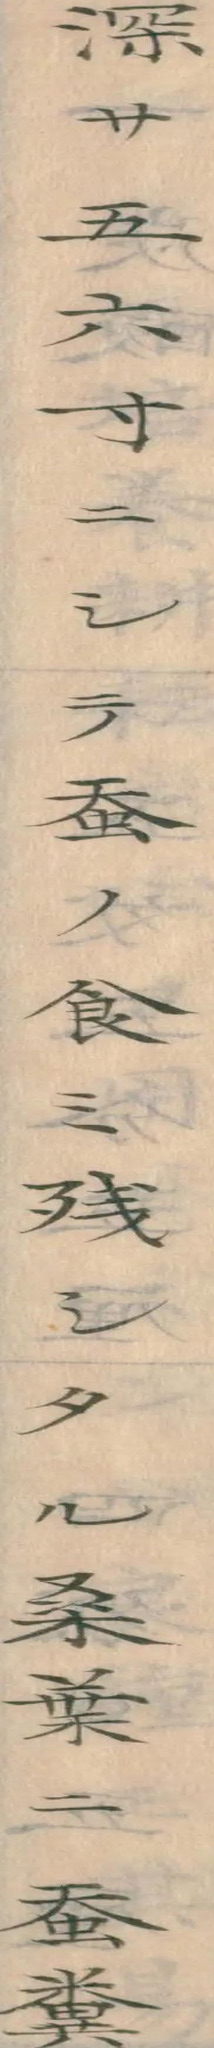深サ五六寸ニシテ蚕ノ食ミ残シタル桑葉ニ蚕糞
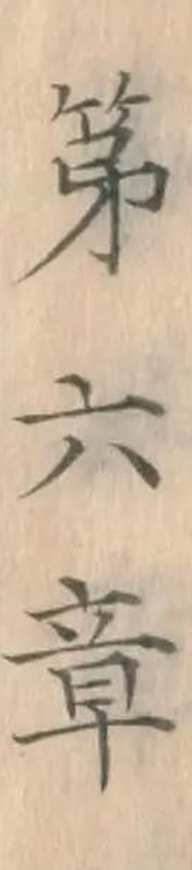第六章
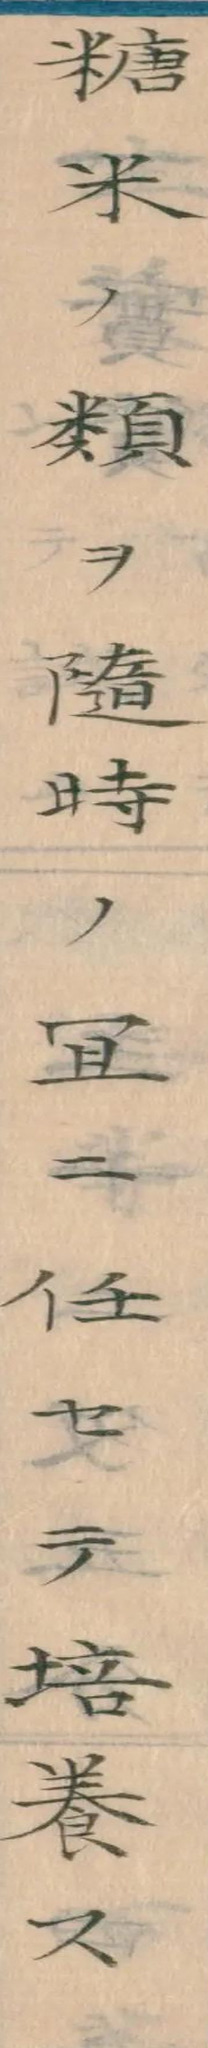糖米ノ類ヲ随時ノ宜ニ任セテ培養ス
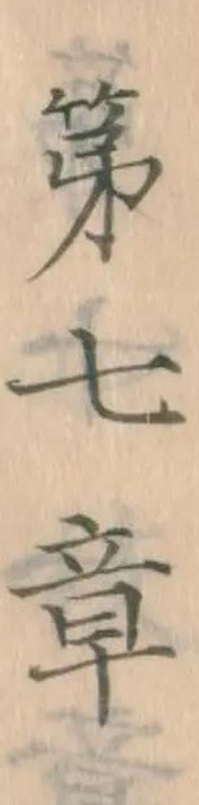第七章
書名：蚕桑集成
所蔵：国立国会図書館 National Diet Library, JAPAN
